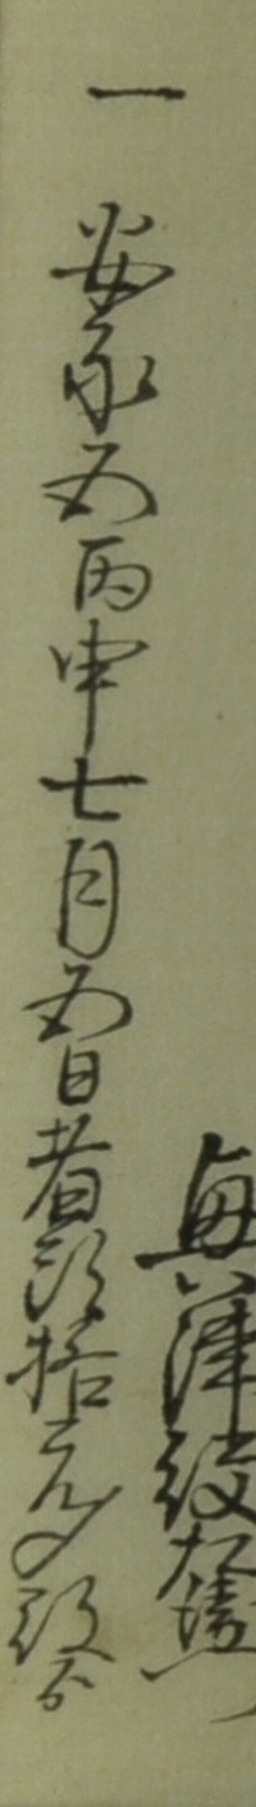一安永五丙申七月五日者頭格元〆役ゟ

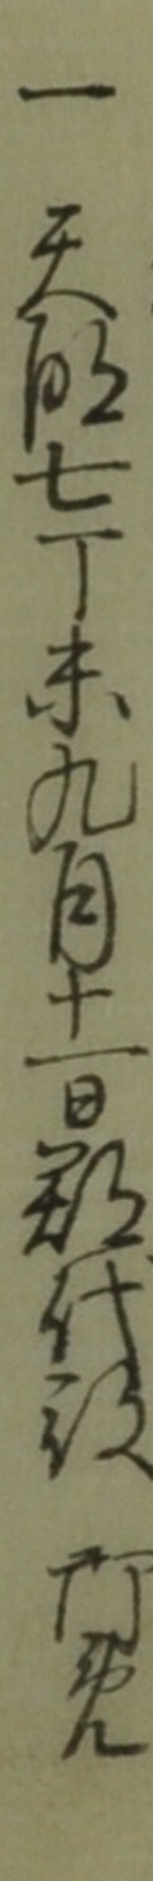一天明七丁未九月十一日郡代役御免
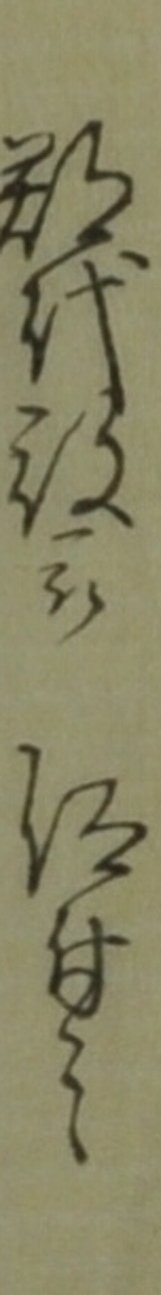郡代役被仰付之
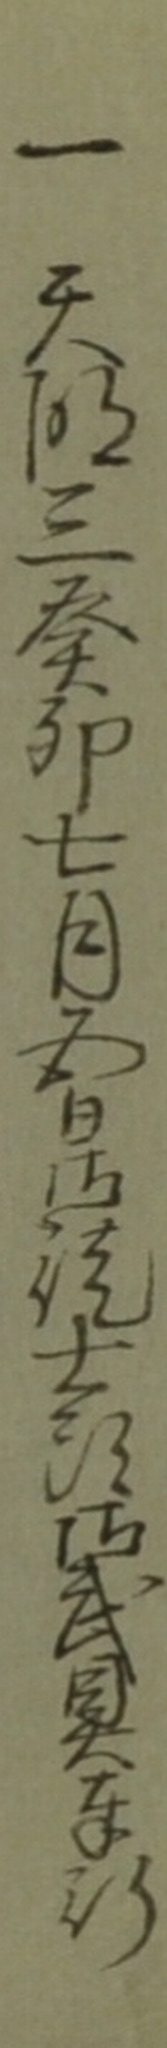一天明三癸卯七月五日御徒士頭御武具奉行
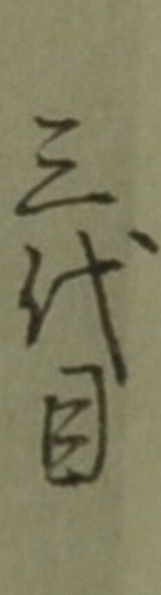三代目
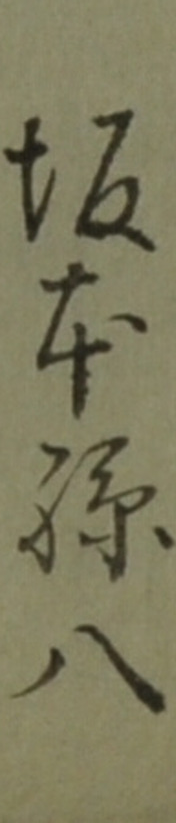坂本孫八
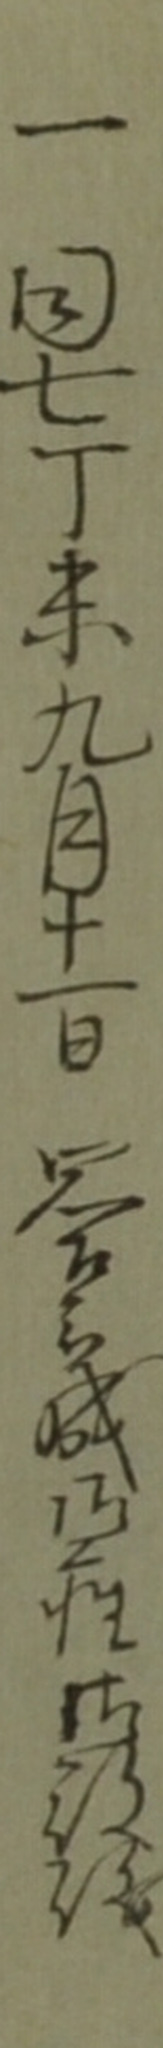一同七丁未九月十一日思召被成御座御役儀
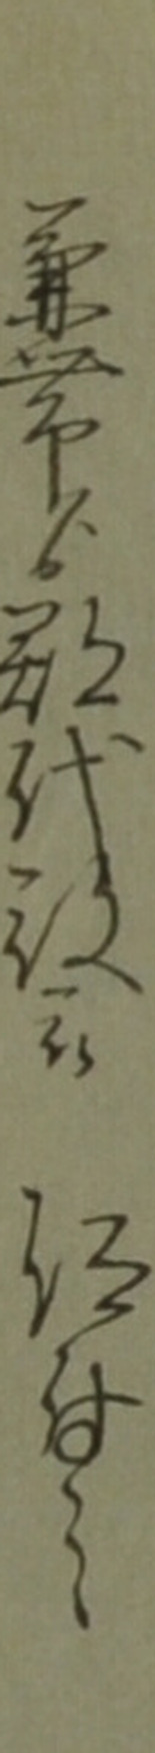兼帯ゟ郡代役被仰付能三之
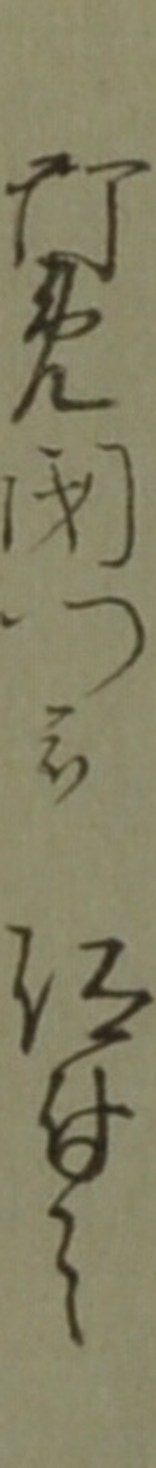御免閉門被仰付之
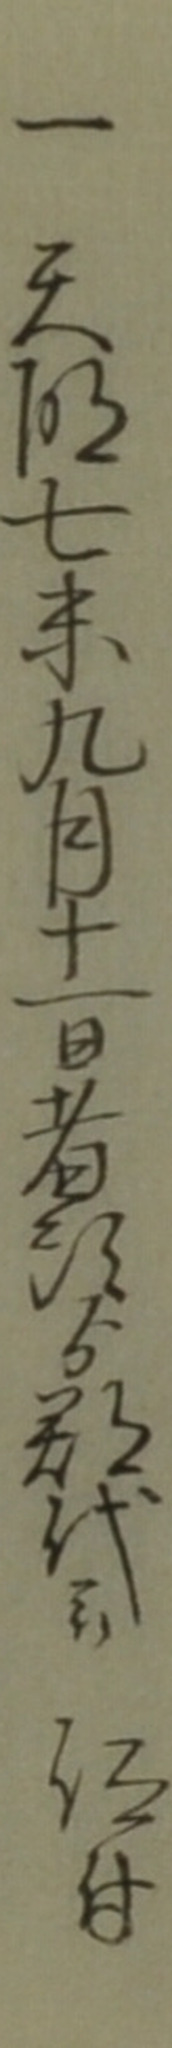一天明七未九月十一日者頭ゟ郡代被仰付
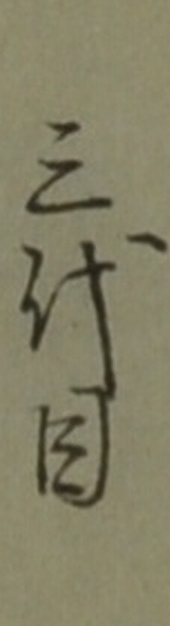三代目
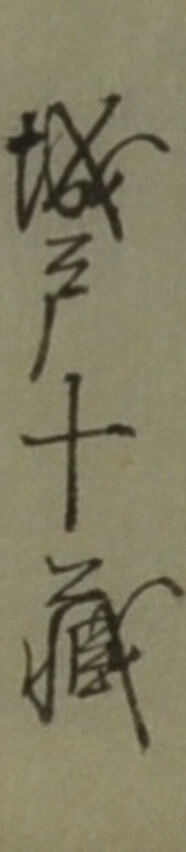城戸十蔵
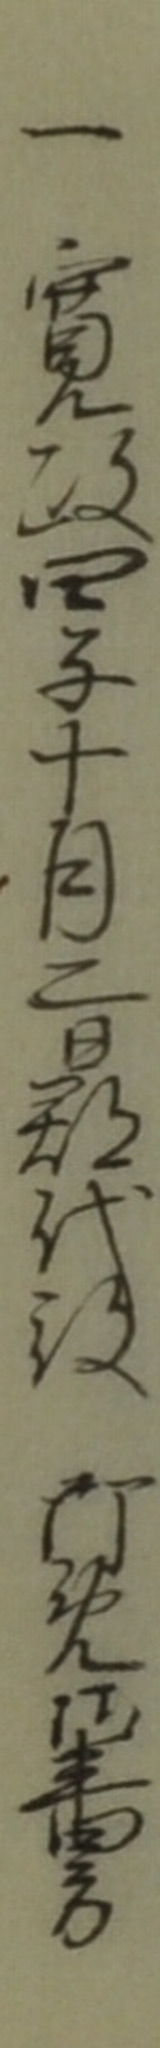一寛政四子十月二日郡代役御免御番方
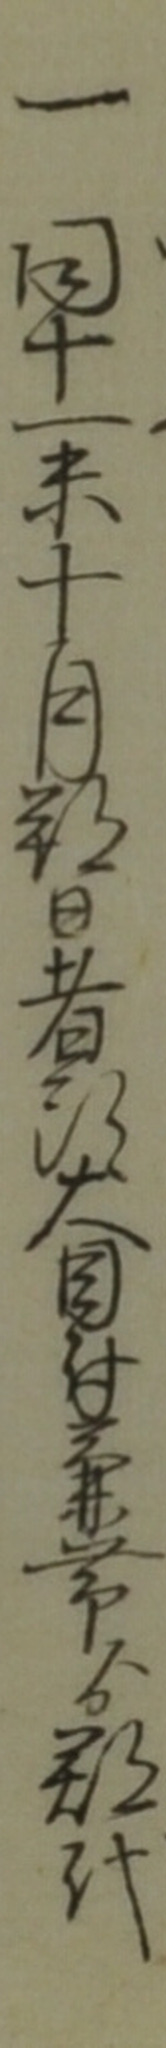一同十一未十月朔日者頭大目付兼帯ゟ郡代
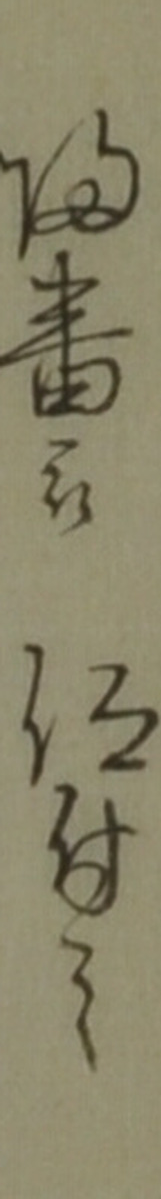帰番被仰付之
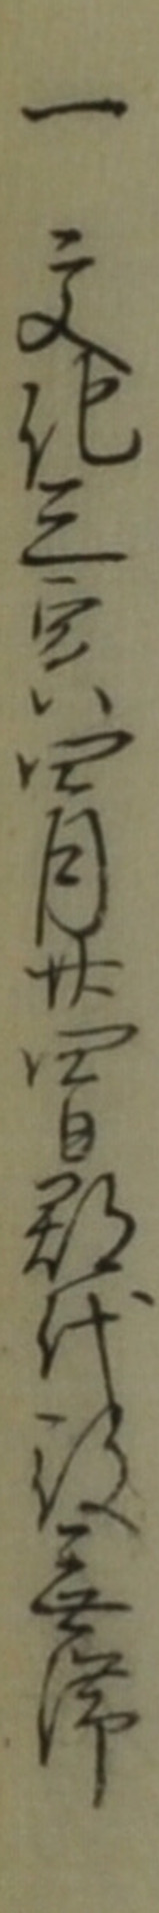一文化三寅四月廿四日郡代役無滞
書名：諸御役代々録（二）
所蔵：伊那市立高遠町図書館・合同会社AMANE
